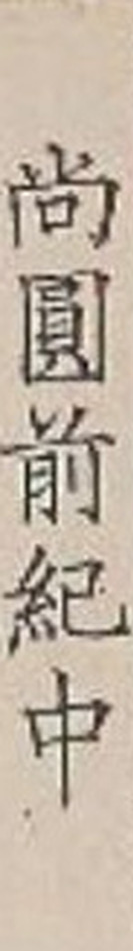尚円前紀中
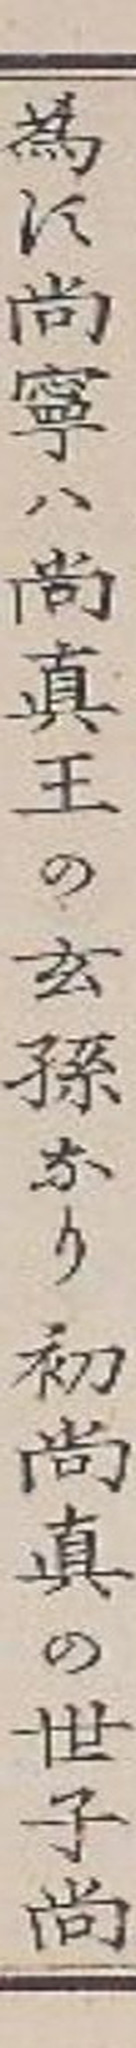為す尚寧は尚真王の玄孫なり初尚真の世子尚
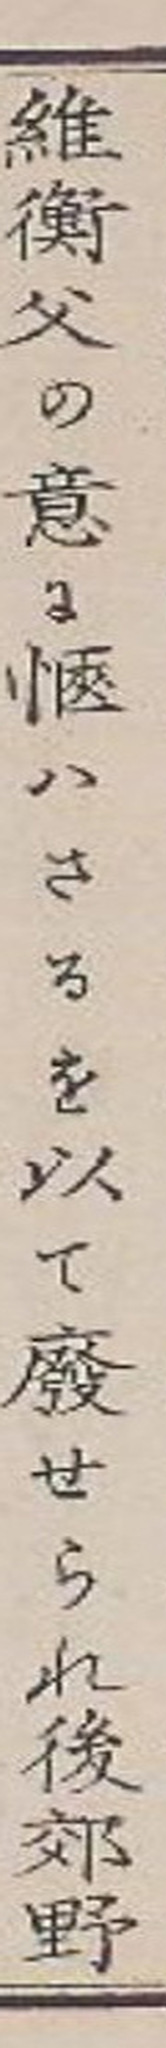維衡父の意に惬はさるを以て廃せられ後郊野
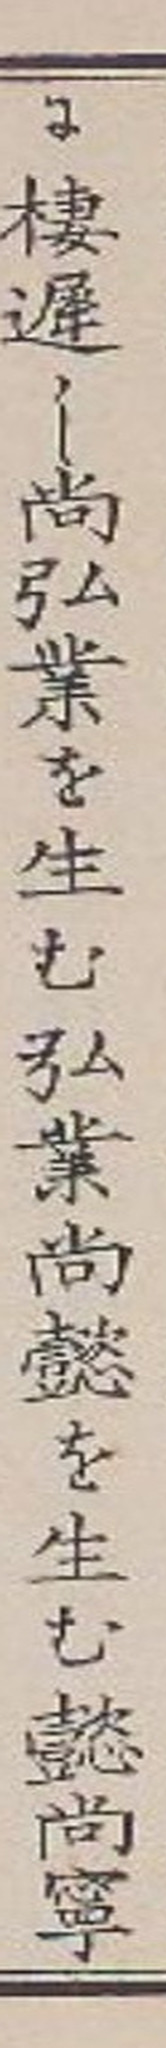に棲遅し尚弘業を生む弘業尚懿を生む懿尚寧
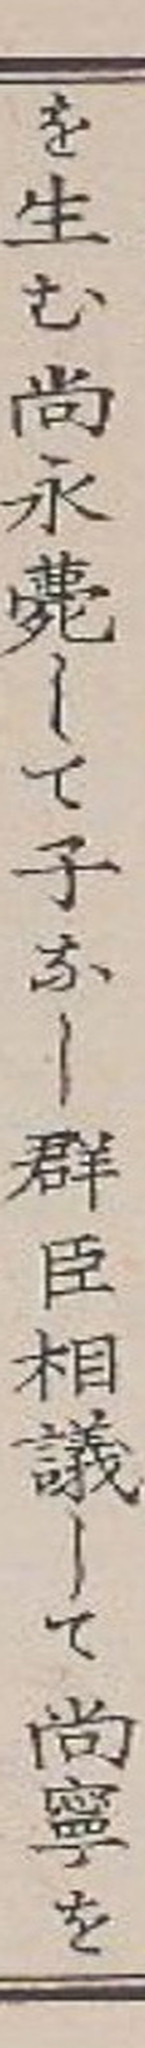を生む尚永薨して子なし群臣相議して尚寧を
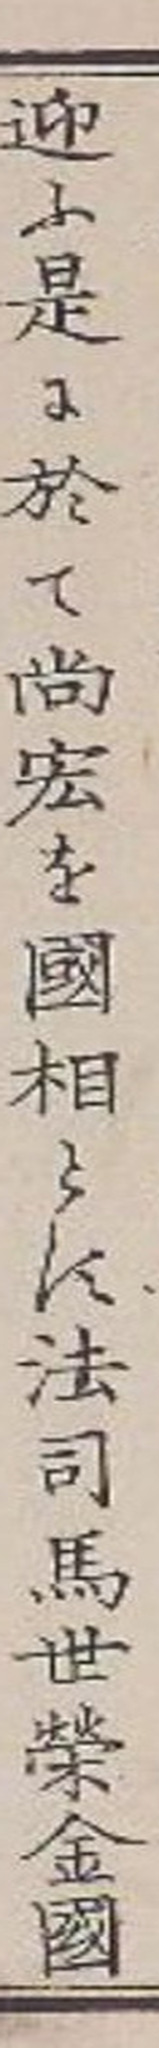迎ふ是に於て寧宏を国相とす法司馬世栄金国
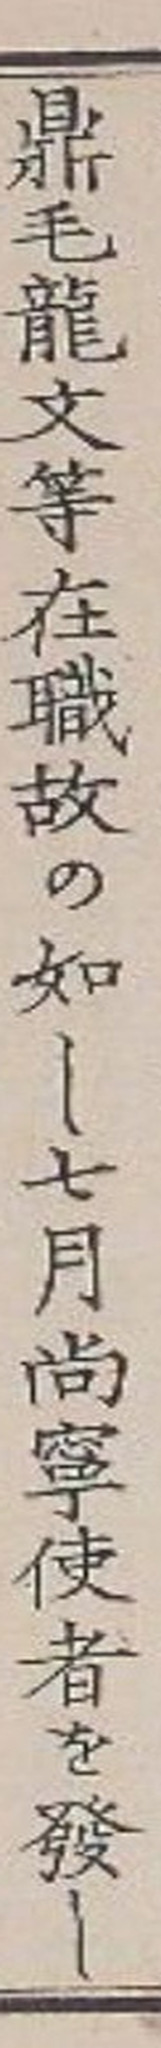鼎毛龍文等在職故の如し七月尚寧使者を発し
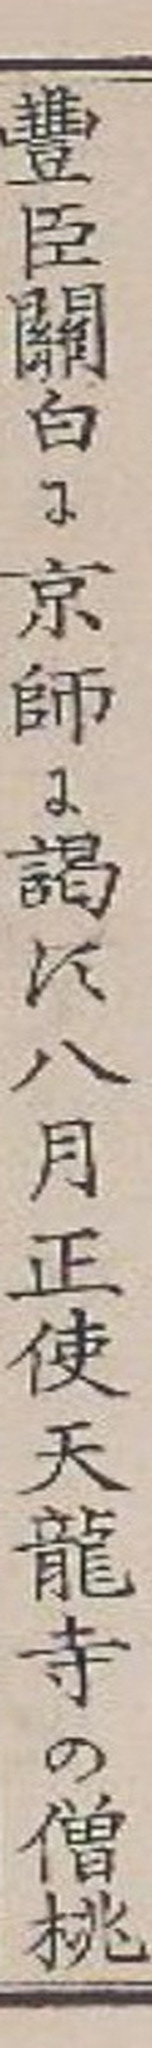豊臣関白に京師に謁す八月正使天龍寺の僧桃

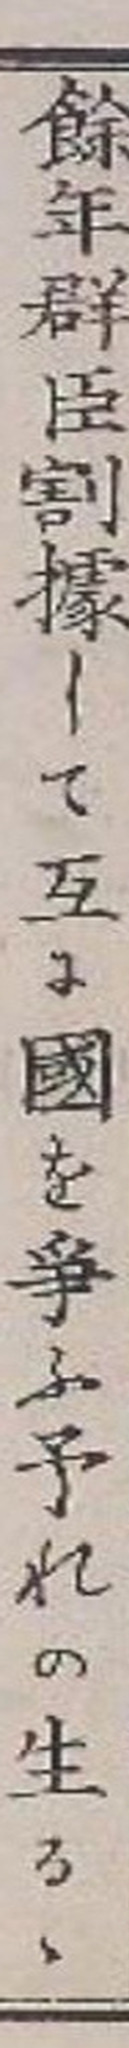余年群臣割拠して互に国を争ふ予れの生るゝ
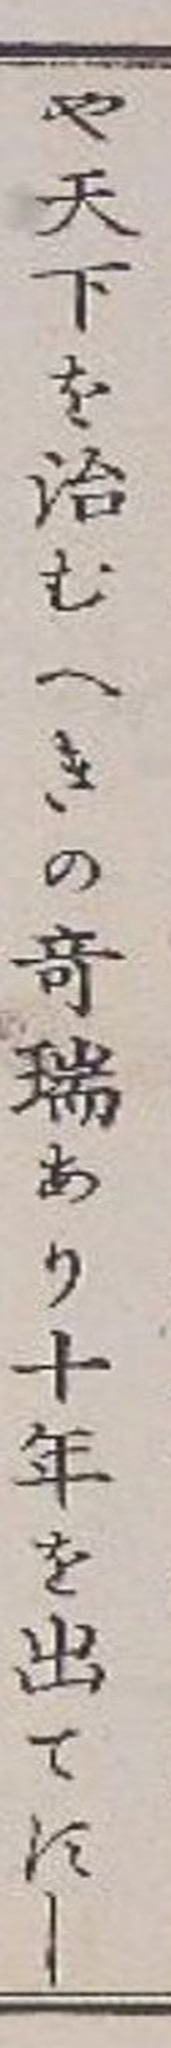や天下を治むへきの奇瑞あり十年を出てすし
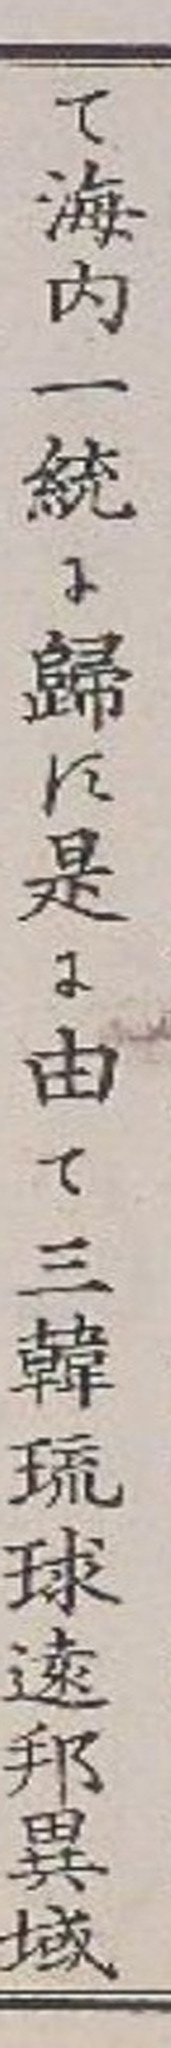て海内一統に帰す是に由て三韓琉球遠邦異域
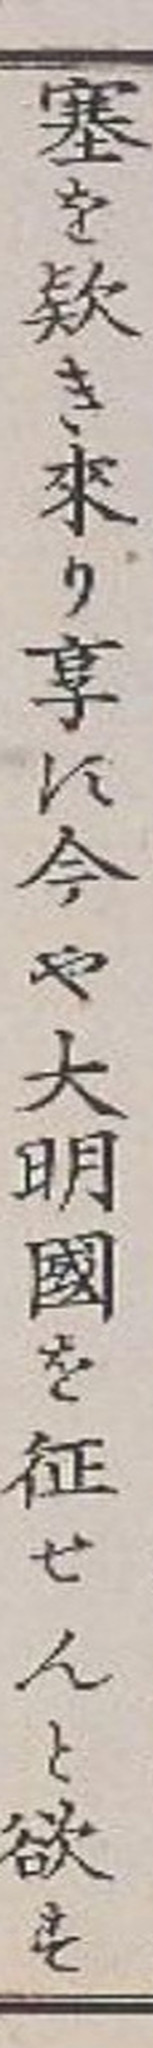塞を款き来り享す今や大明国を征せんと欲す
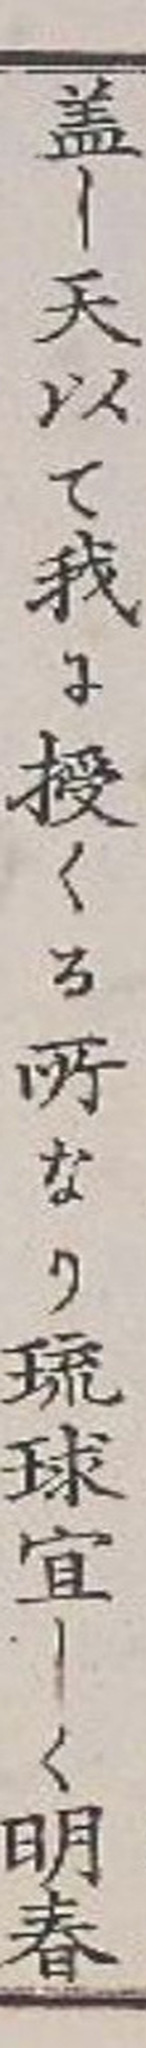盖し天以て我に授くる所なり琉球宜しく明春
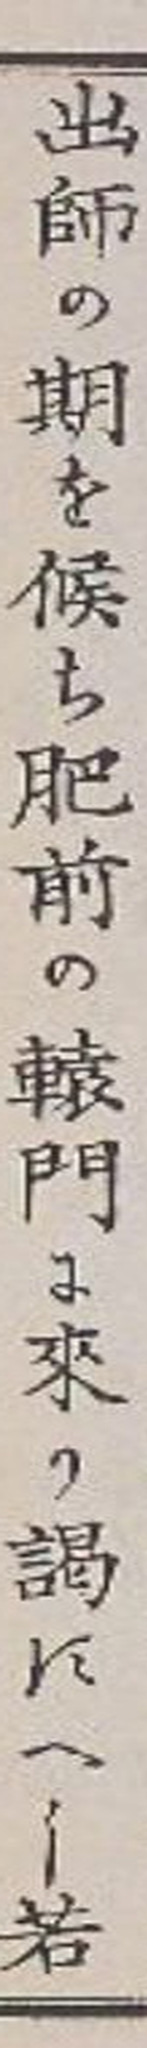出師の期を候ち肥前の轅門に来り謁すへし若
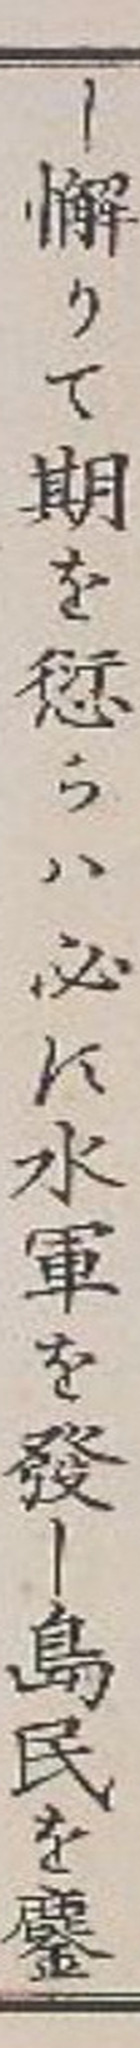し懈りて期を愆らは必す水軍を発し島民を鏖
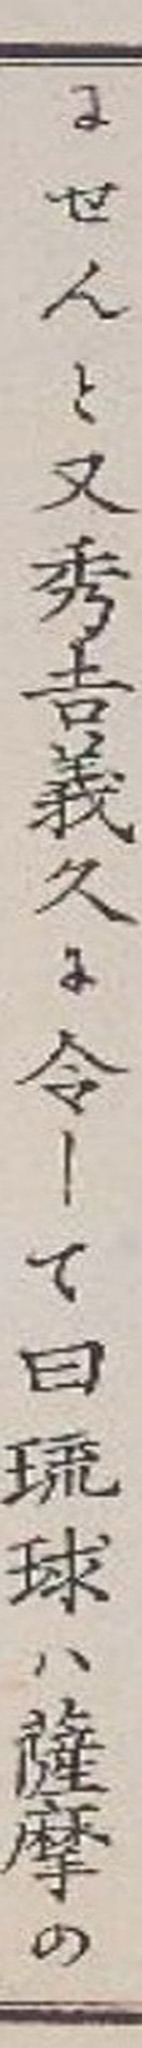にせんと又秀吉義久に令して曰琉球は薩摩の
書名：南島紀事 中
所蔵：University of the Ryukyus Library
